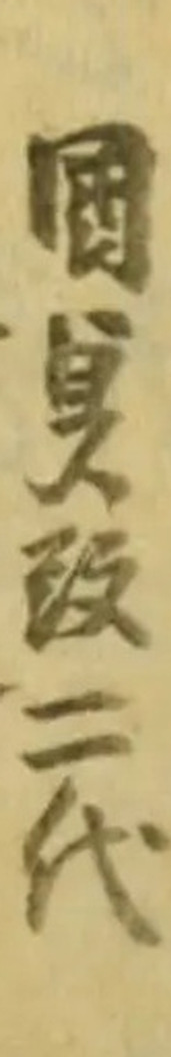国貞改二代
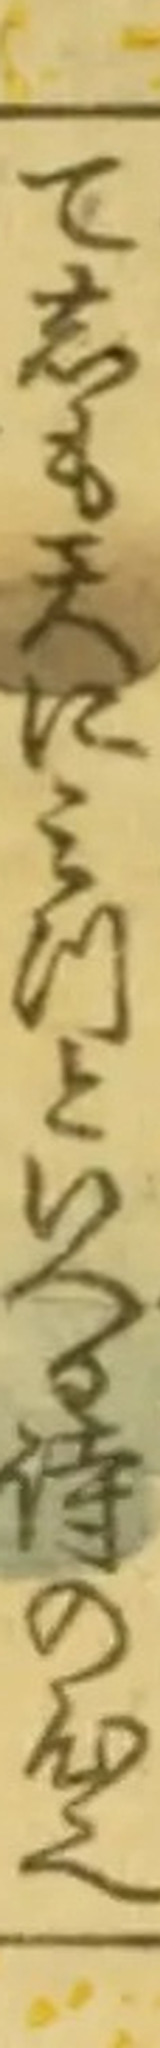てしも天にみつといへる詩の心也
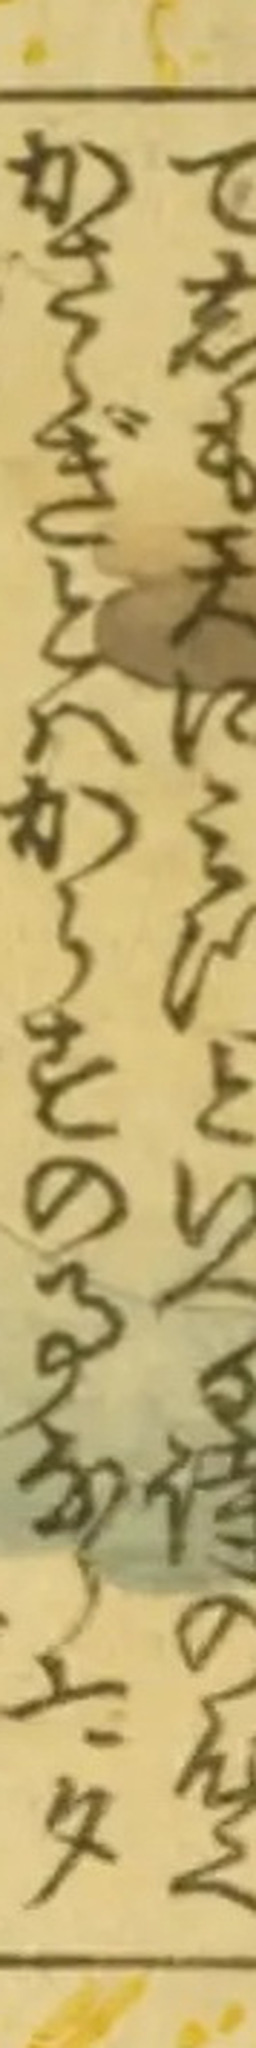かさゝぎとはからすの事なり七夕
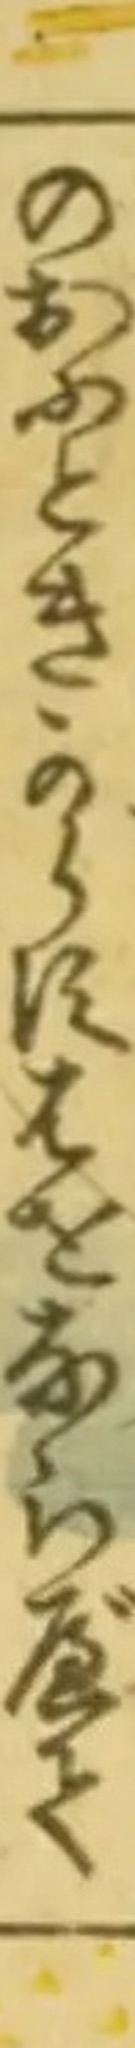のおふときからすはをならべて
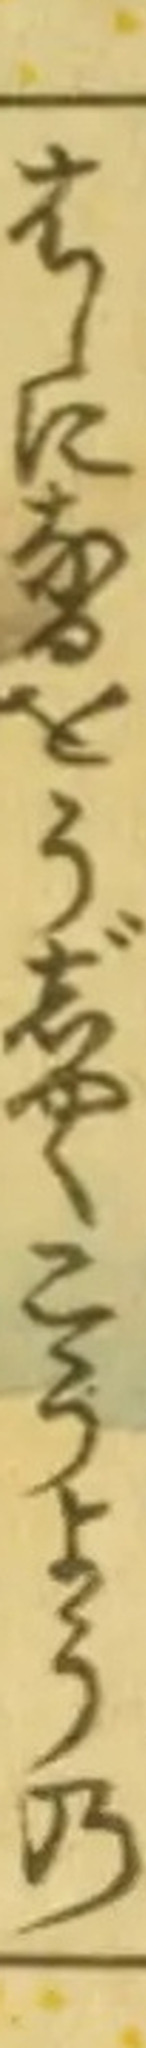はしになるをうじやくこうようの
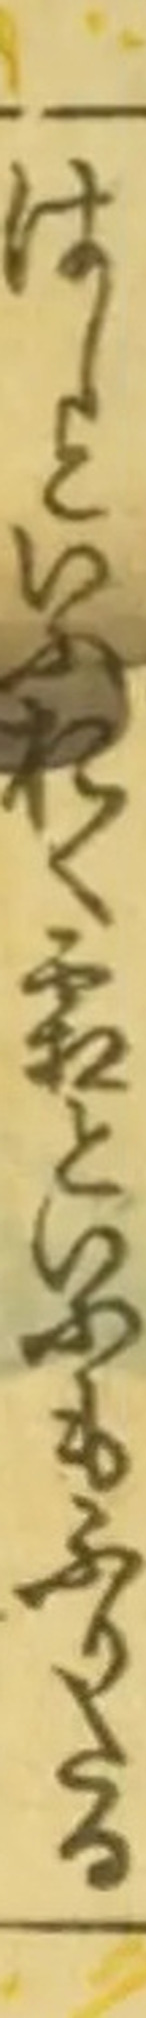はしといふおく霜といふもふりたる
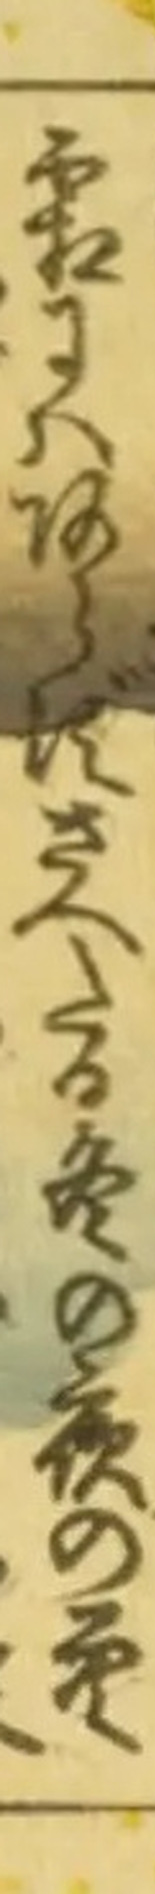霜にはあらずさへたる冬の夜の空
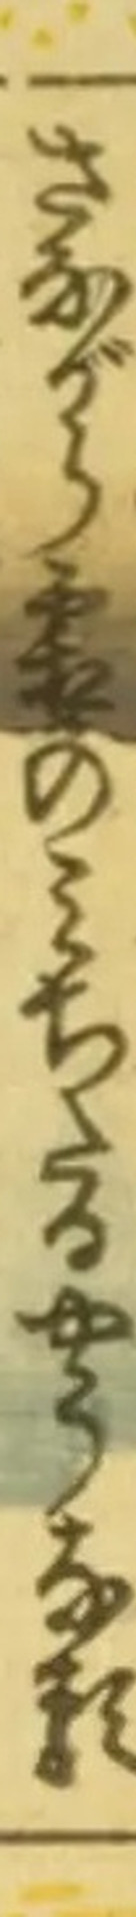さながら霜のみちたるやうなる
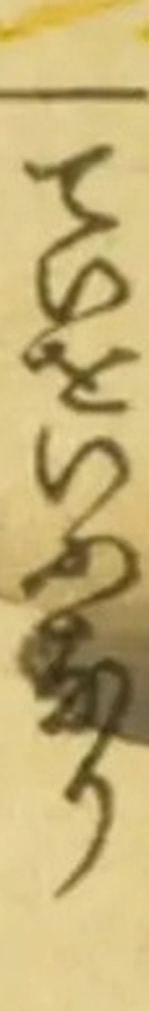ていをいふなり
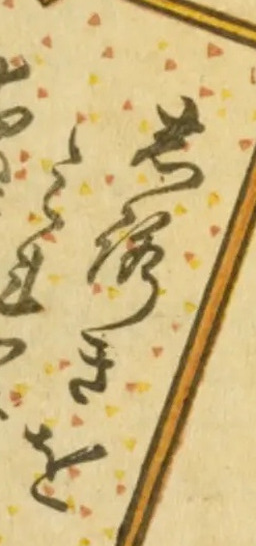しろきを
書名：百人一首絵抄　六　中納言家持
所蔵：国立国会図書館 National Diet Library, JAPAN
